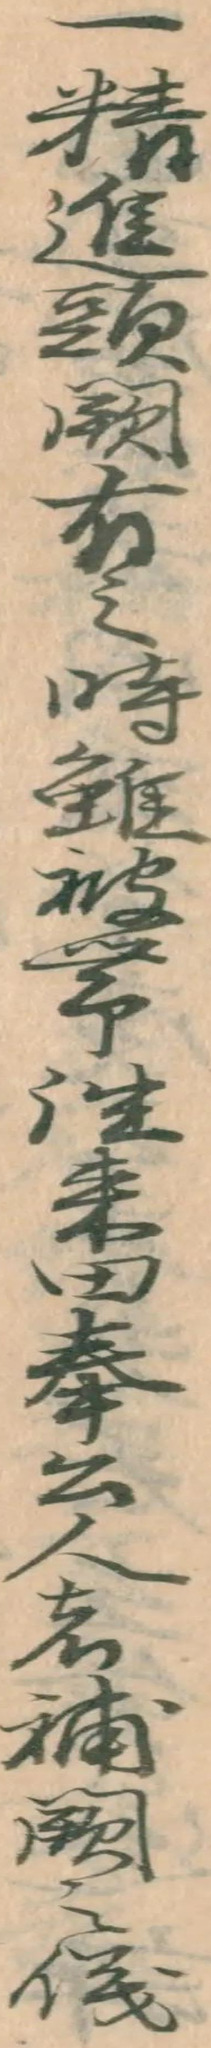一、精進頭闕有之時雖被帯往来田奉公人者補闕之儀
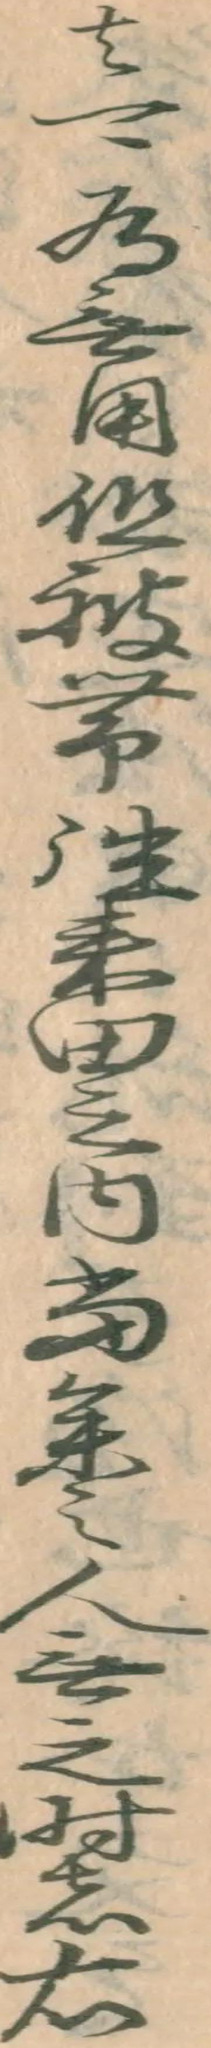者可為無用但被帯往来田之内當参之人無之時者右
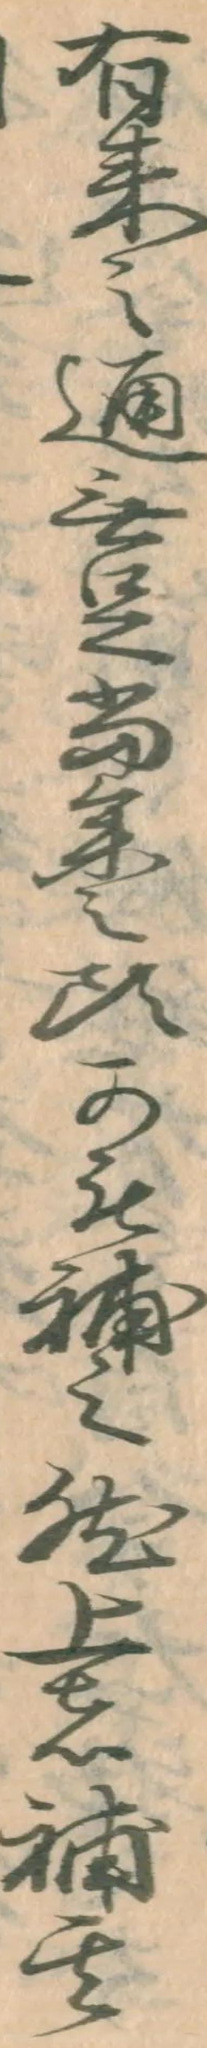有来之通無足當参之頭可被補之然上者補其
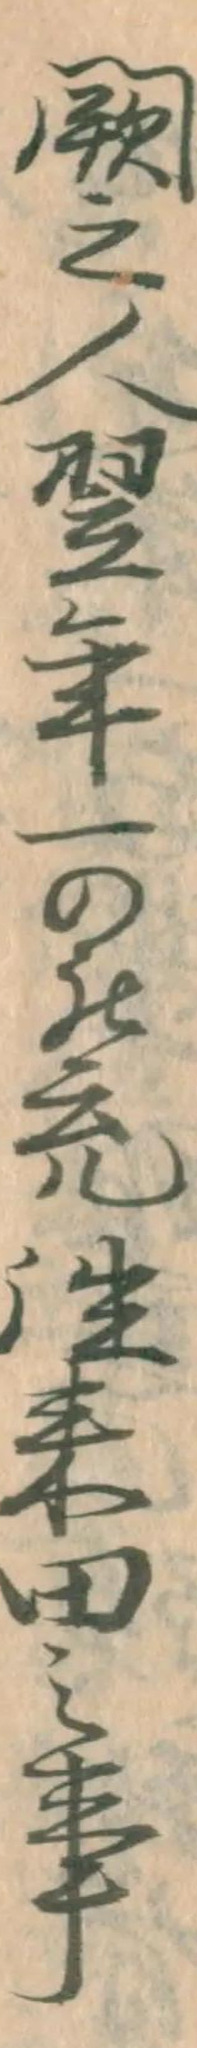闕之人翌年可被罷充往来田之事
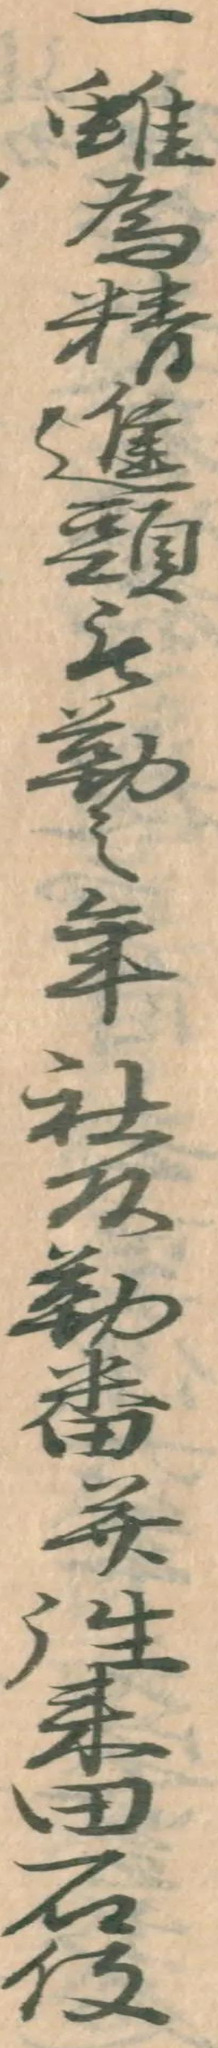一、雖為精進頭被勤之年社頭勤番并往来田石役
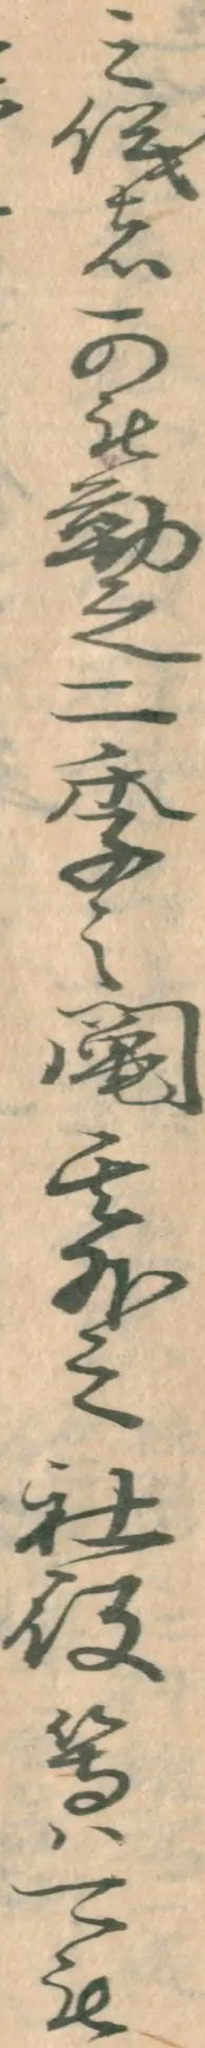之儀者可被勤之二季之鬮其外之社役等は可被
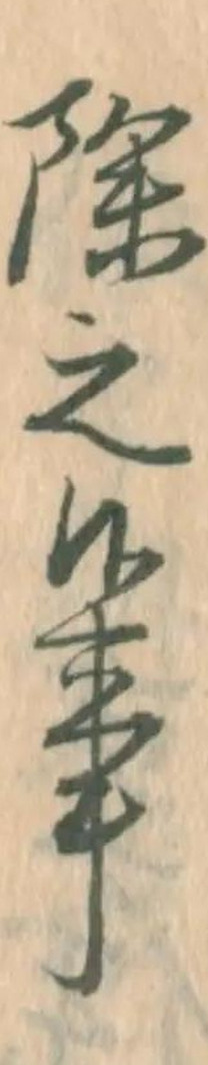除之候事
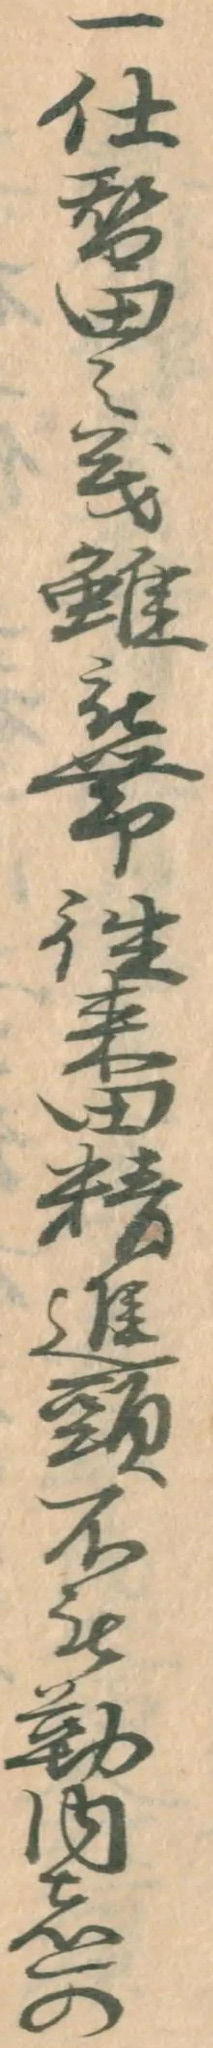一、仕替田之義雖被帯往来田精進頭不被勤内者可
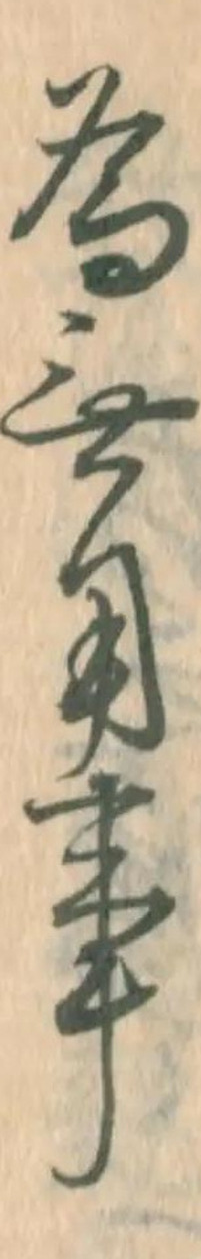為無用事

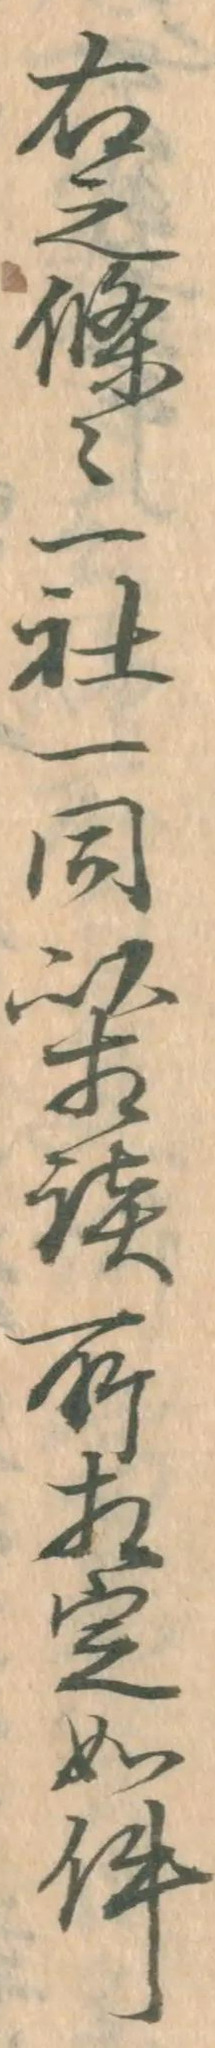右之條々一社一同以相談所相定如件
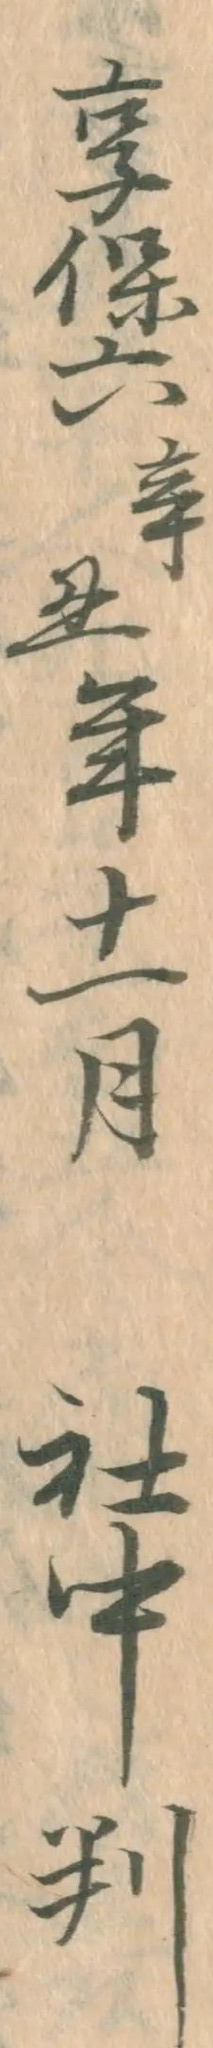享保六辛丑年十一月社中判
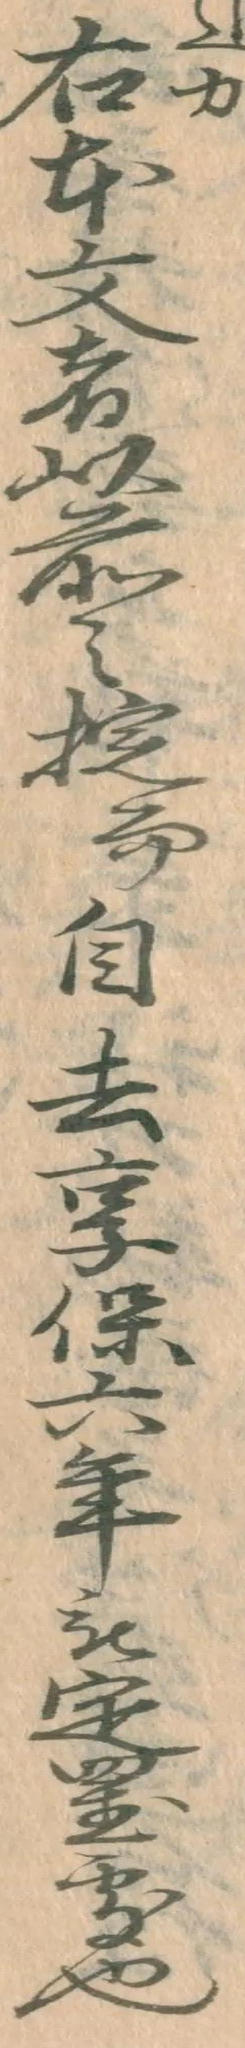右本文者以前之掟而自去享保六年被定置處也
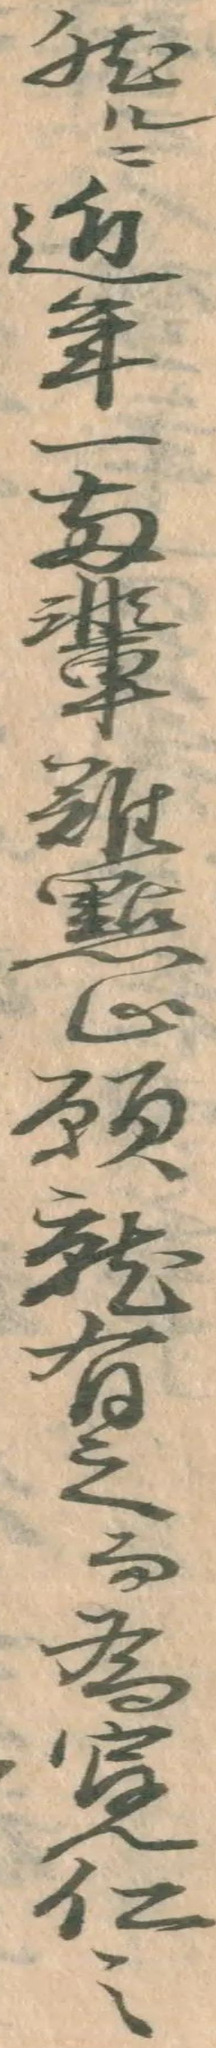然ルニ近年一両輩難黙止願就有之而為寛仁之
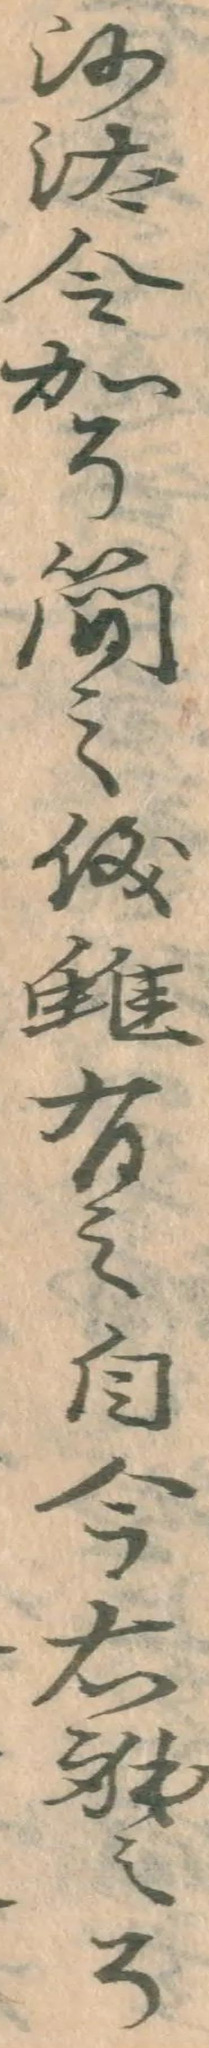沙汰令加了簡之儀雖有之自今右躰之了
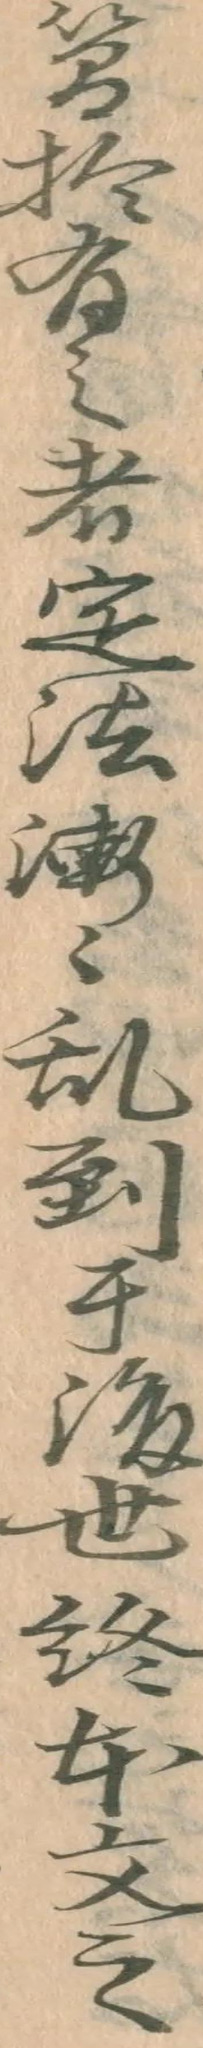簡於有之者定法漸々乱到于後世終本文之
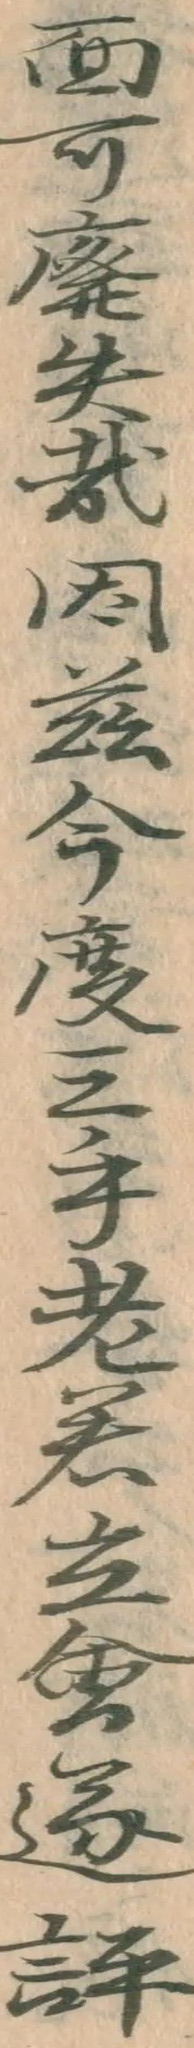面可廃失哉因茲今度三手老若立會遂評
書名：賀茂社記録. 第39冊
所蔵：国立国会図書館 National Diet Library, JAPAN
